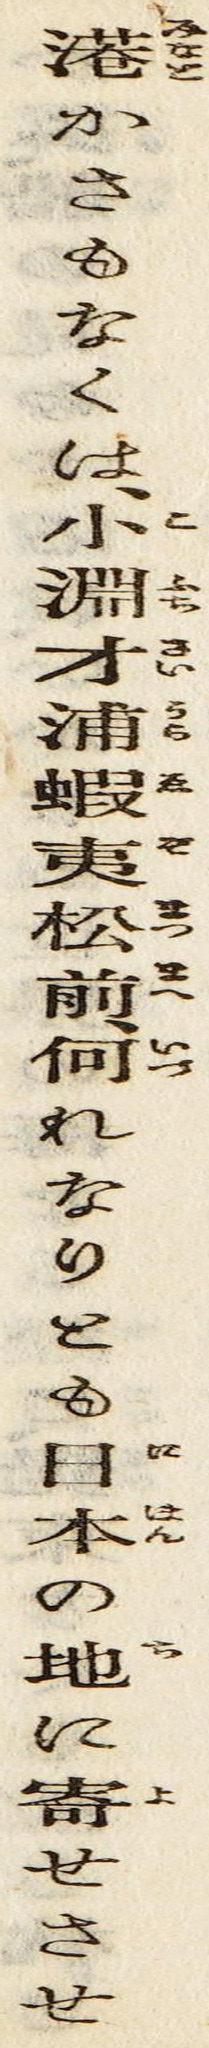港かさもなくは、小淵才浦蝦夷松前、何れなりとも日本の地に寄せさせ
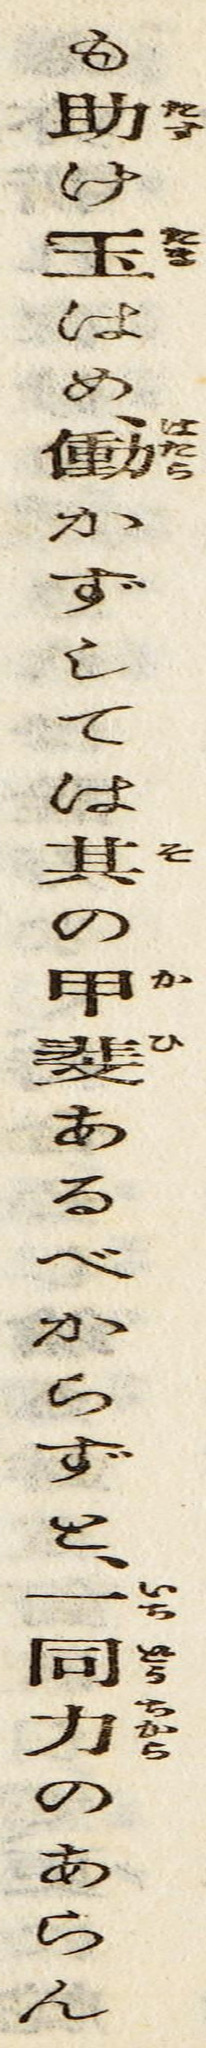も助け玉はめ、働かずしては其の甲斐あるべからずと、一同力のあらん
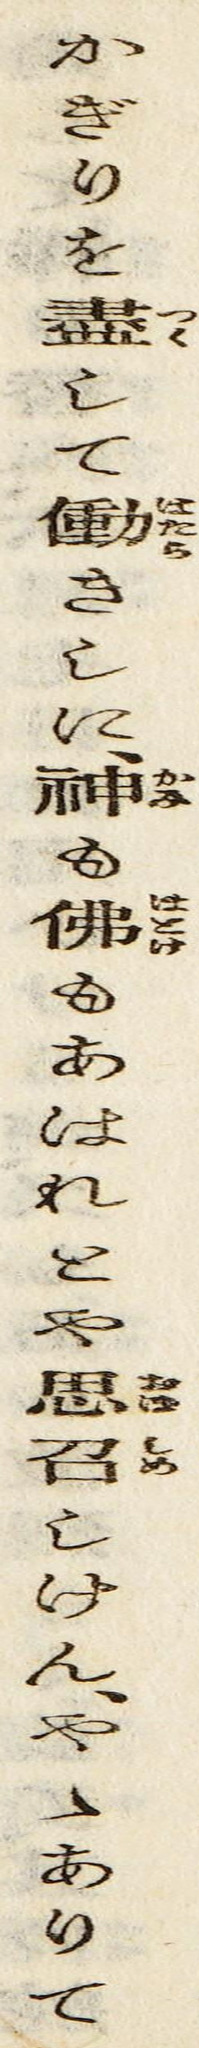かぎりを尽して働きしに、神も仏もあはれとや思召しけん、やゝありて
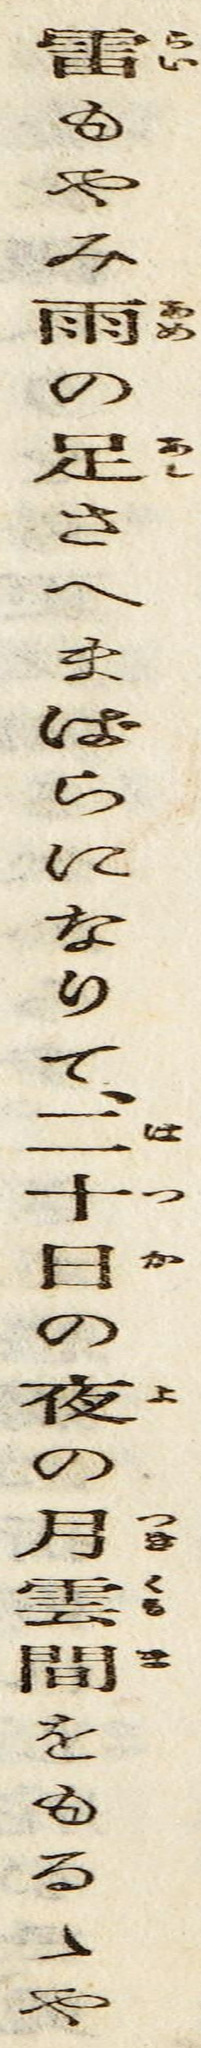雷もやみ雨の足さへまばらになりて、二十日の夜の月雲間をもるゝや
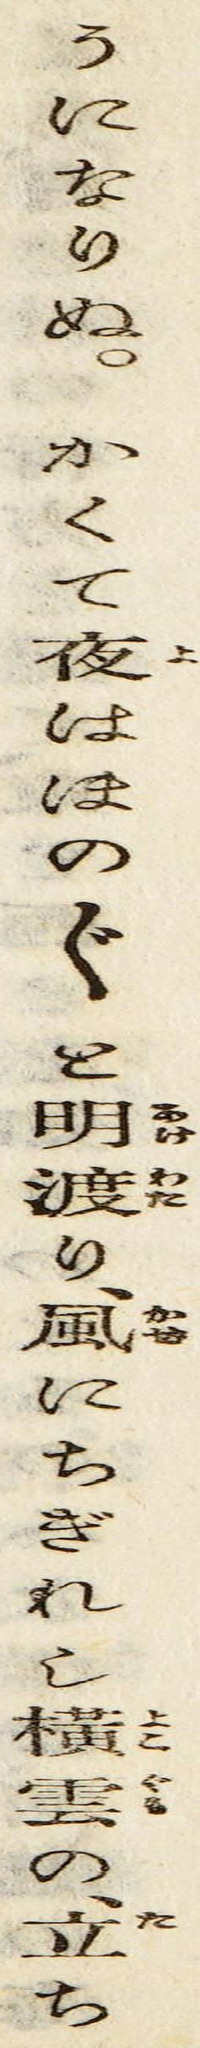うになりぬ。かくて夜はほの〴〵と明渡り、風にちぎれし横雲の、立ち
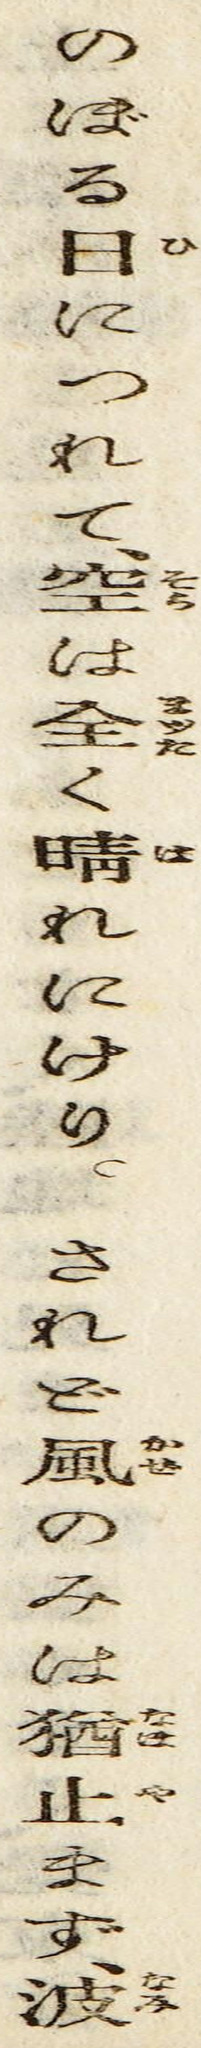のぼる日につれて、空は全く晴れにけり。されど風のみは猶止まず、波
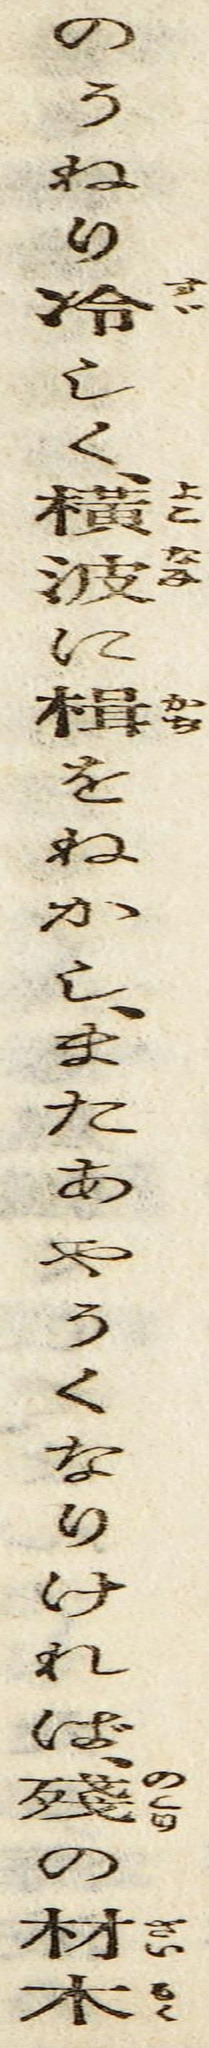のうねり冷しく、横波に楫をねかし、またあやうくなりければ、残の材木

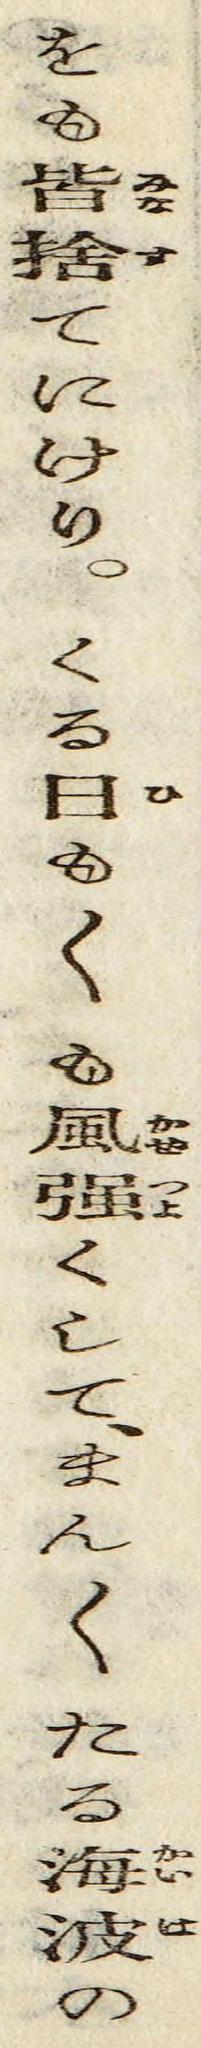をも皆捨てにけり。くる日も〳〵も風強くして、まん〳〵たる海波の
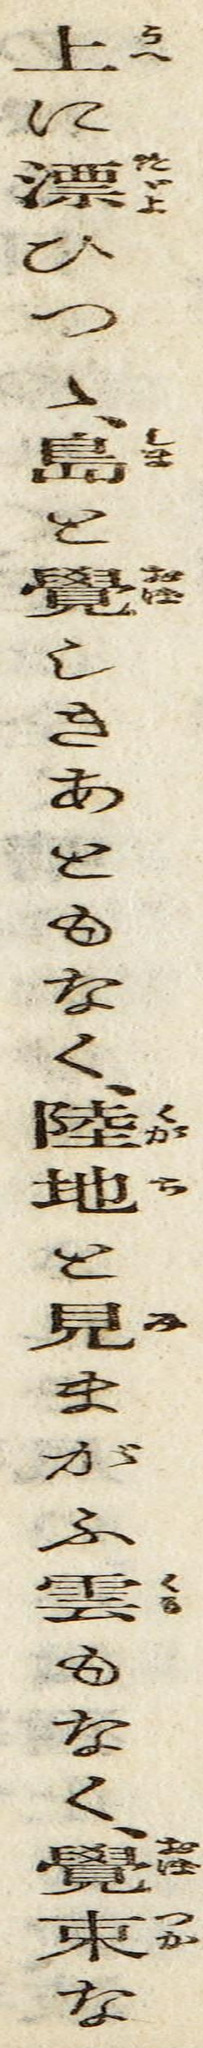上に漂ひつゝ、島と覚しきあともなく、陸地と見まがふ雲もなく、覚束な
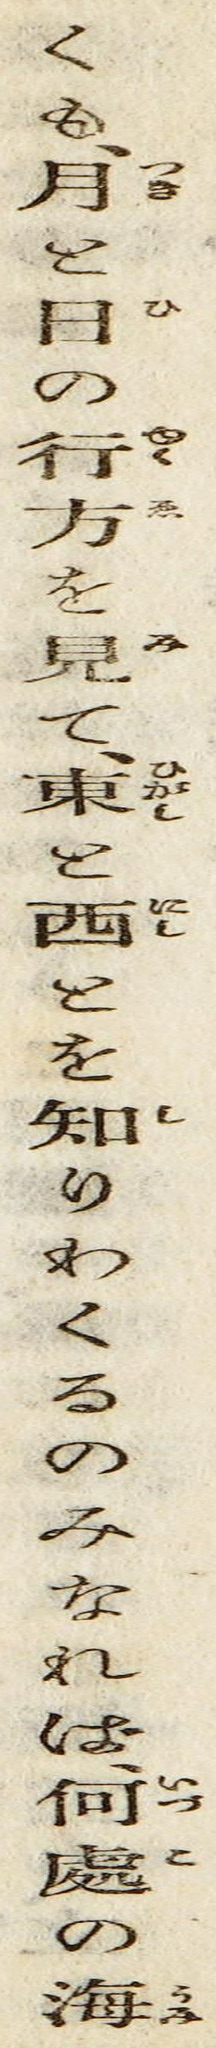くも、月と日の行方を見て、東と西とを知りわくるのみなれば、何処の海
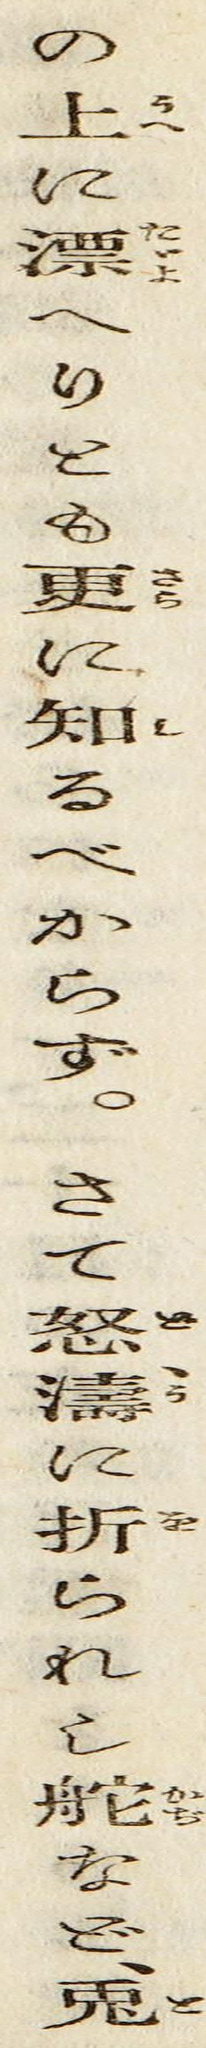の上に漂へりとも更に知るべからず。さて怒濤に折られし舵など、兎
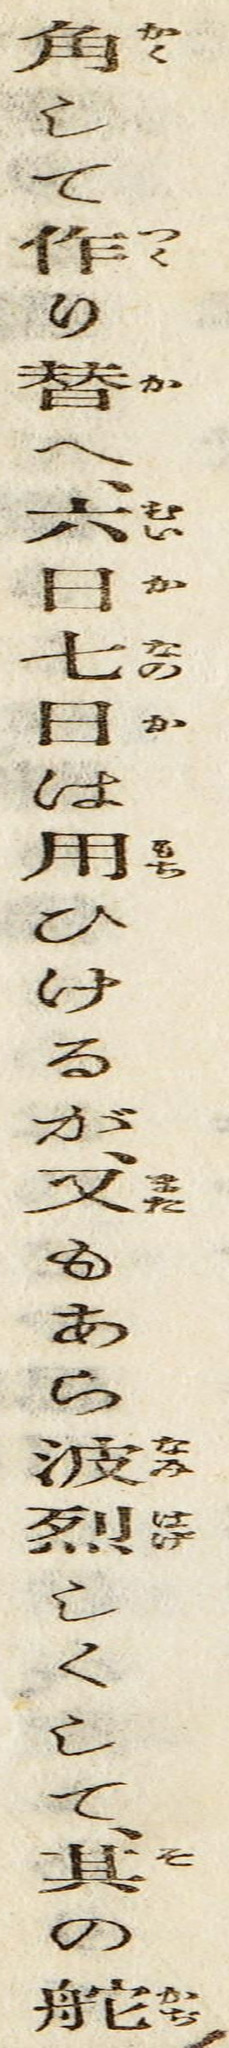角して作り替へ、六日七日は用ひけるが、又もあら波烈しくして、其の舵
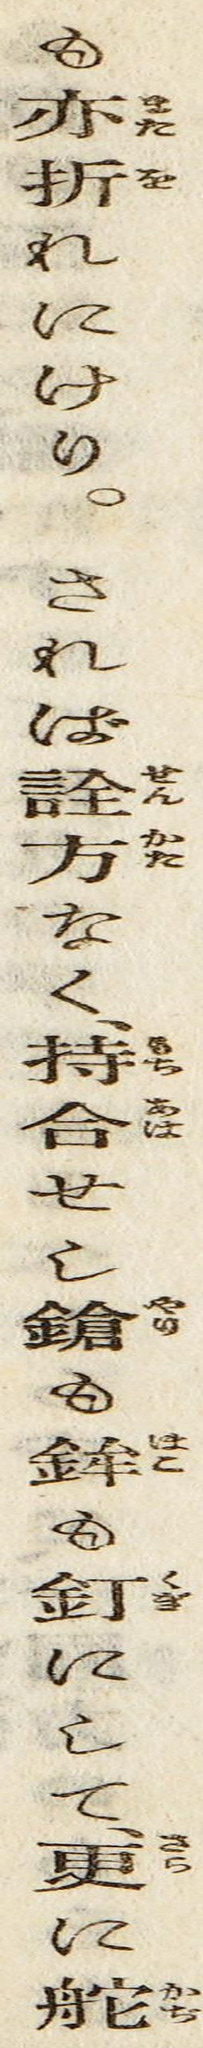も亦折れにけり。されば詮方なく、持合せし鎗も鉾も釘にして、更に舵
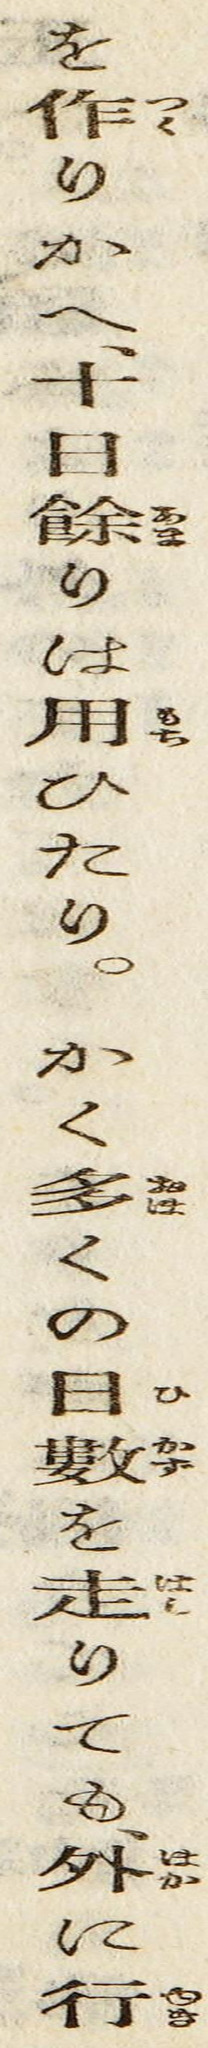を作りかへ、十日余りは用ひけたり。かく多くの日数を走りても、外に行
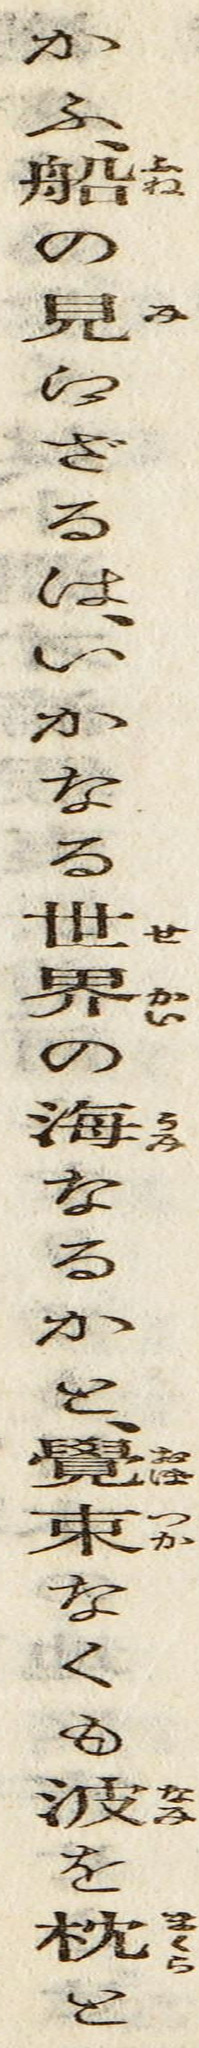かふ、船の見えざるは、いかなる世界の海なるかと、覚束なくも波を枕と
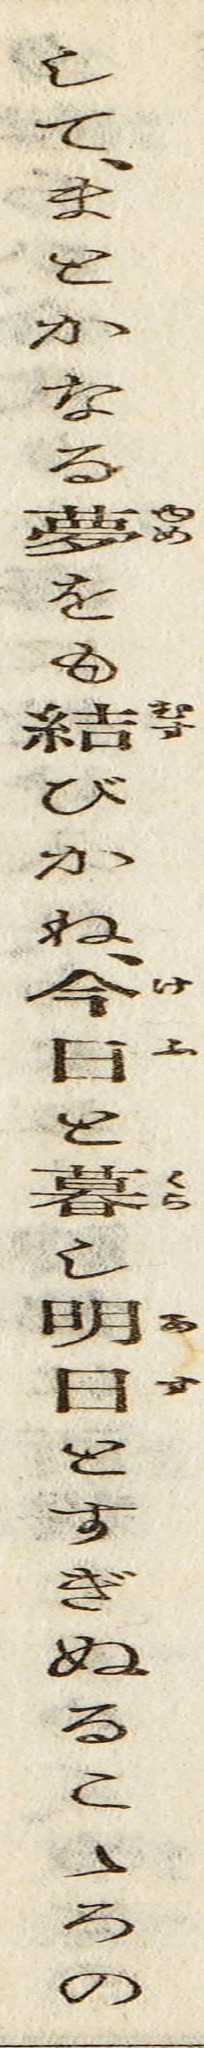して、まとかなる夢をも結びかね、今日と暮し明日とすぎぬるこゝろの
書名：日本漂流譚
